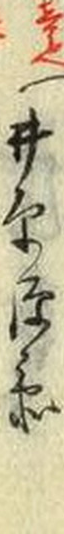井原源兵衛
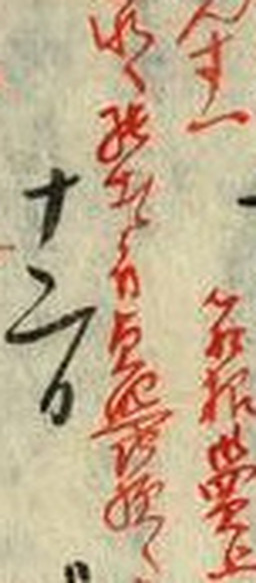廿二日
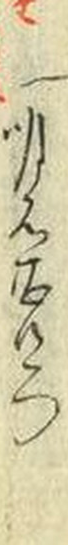明石甚左衛門
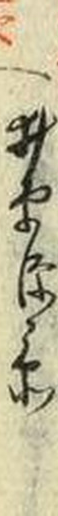井原源兵衛
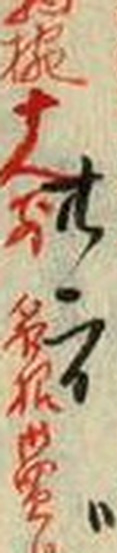廿二日
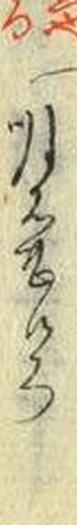明石甚左衛門
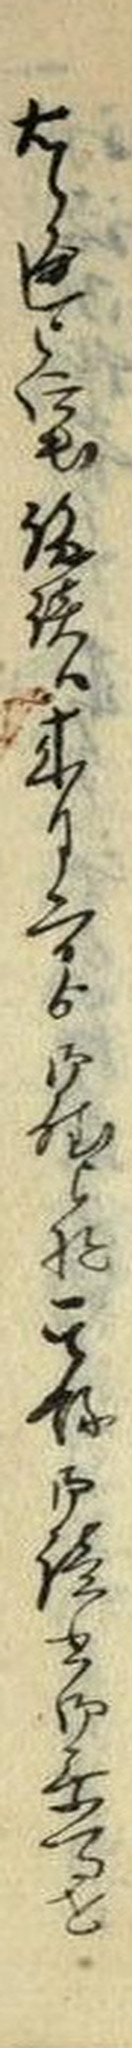右之通被仰出講談ハ来月二日ゟ御聴被遊其余御読書御乗馬を

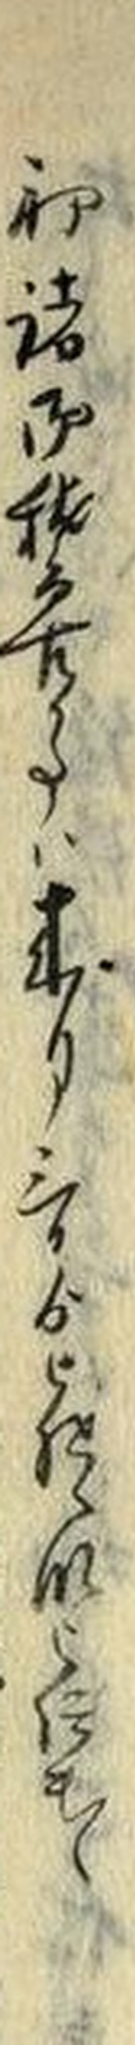初諸御稽古事ハ来月三日ゟ被遊候段被仰出候
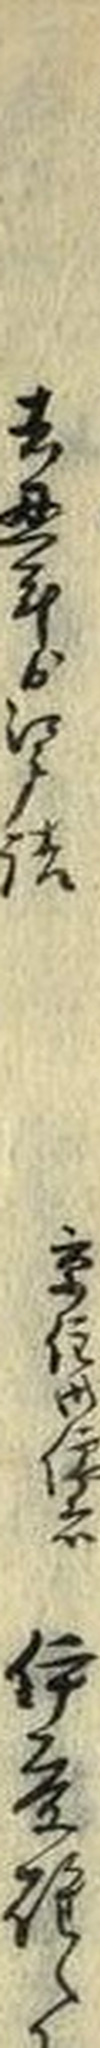去丑年ゟ江戸詰京住御儒者伊藤雄之進
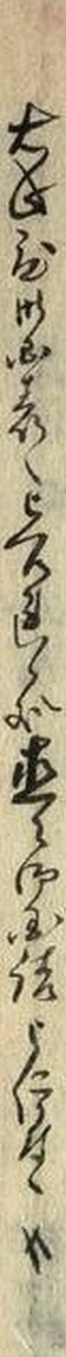右此度御国表へ被召連候処直ニ御国詰被仰付候
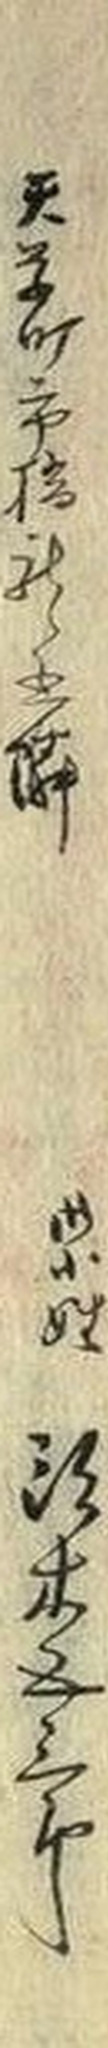天草町市橋新之丞隣御小姓鈴木五三郎
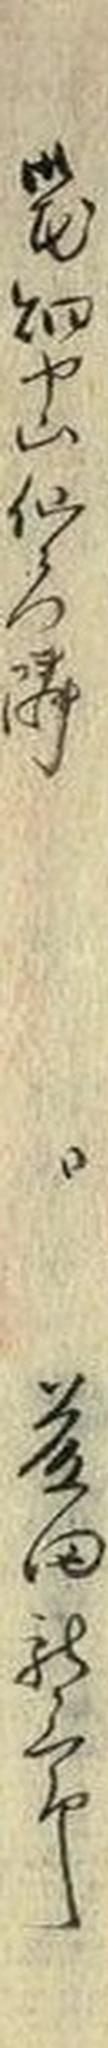御花畑中山仙右衛門隣同藤田新三郎
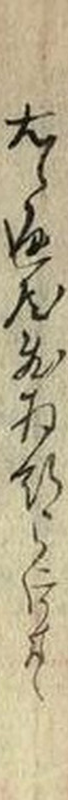右之通屋敷拝領被仰付候
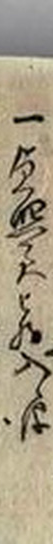一貞照殿被為入候儀
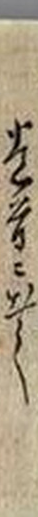巻首ニ出之
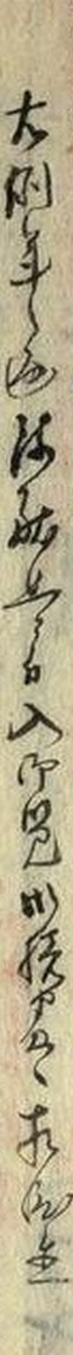右例年之通致献上候ニ付入御覧御膳番へ相渡置
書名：少傅日録抄（斉承付側向頭取日記、在国）
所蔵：福井県文書館 Fukui Prefectural Archives
